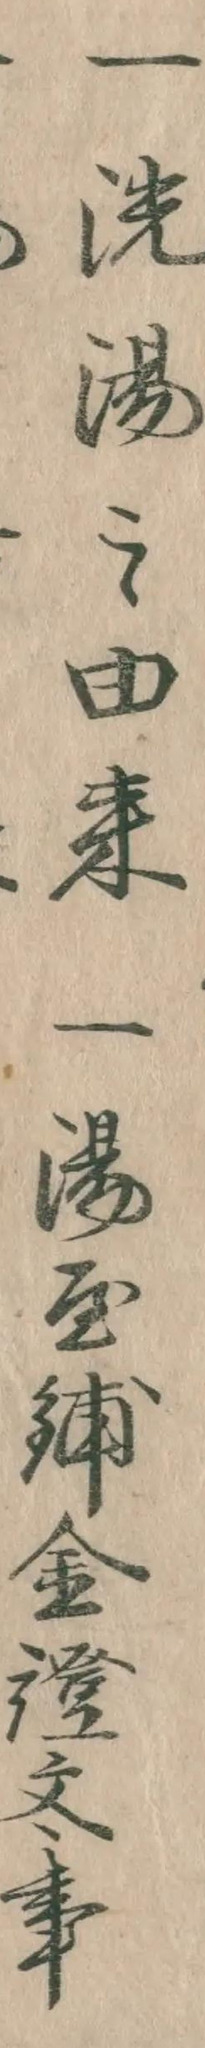一洗湯之由来一湯屋鋪金証文之事
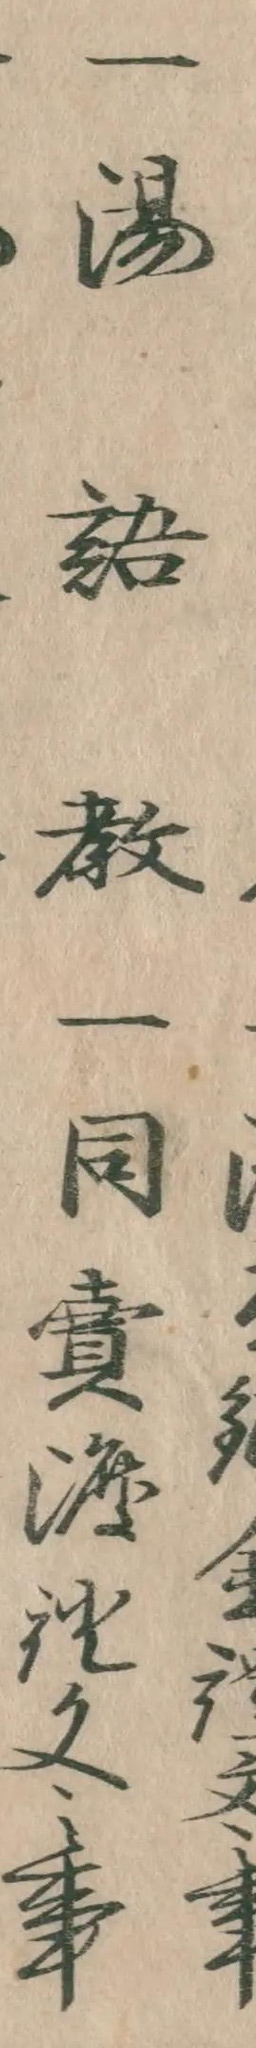一湯語教一同売渡証文之事
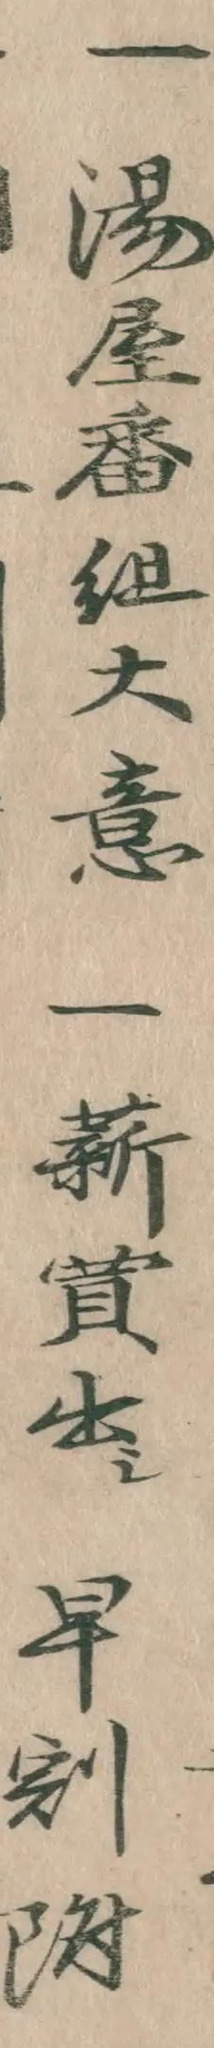一湯屋番組大意一薪買出早割付
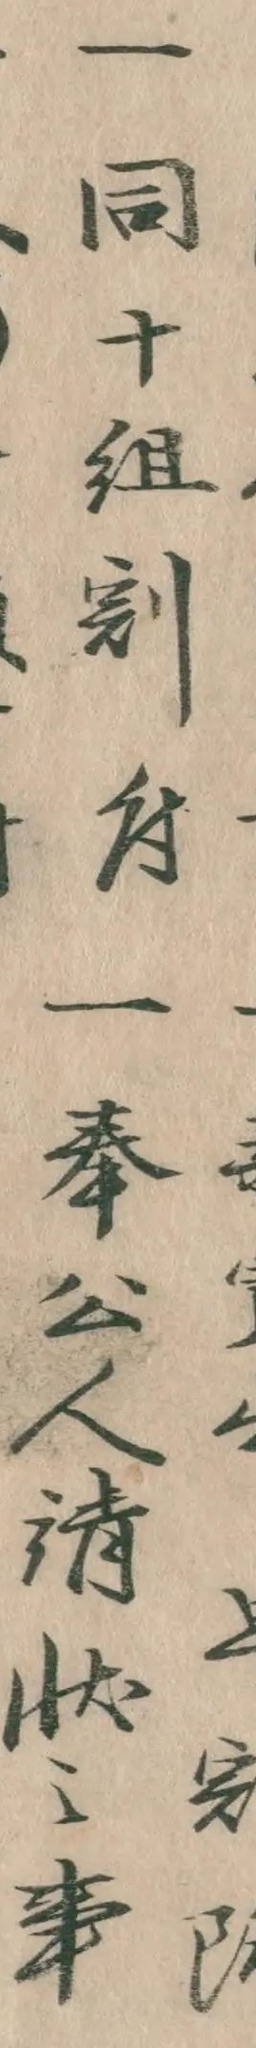一同十組割付一奉公人請状之事
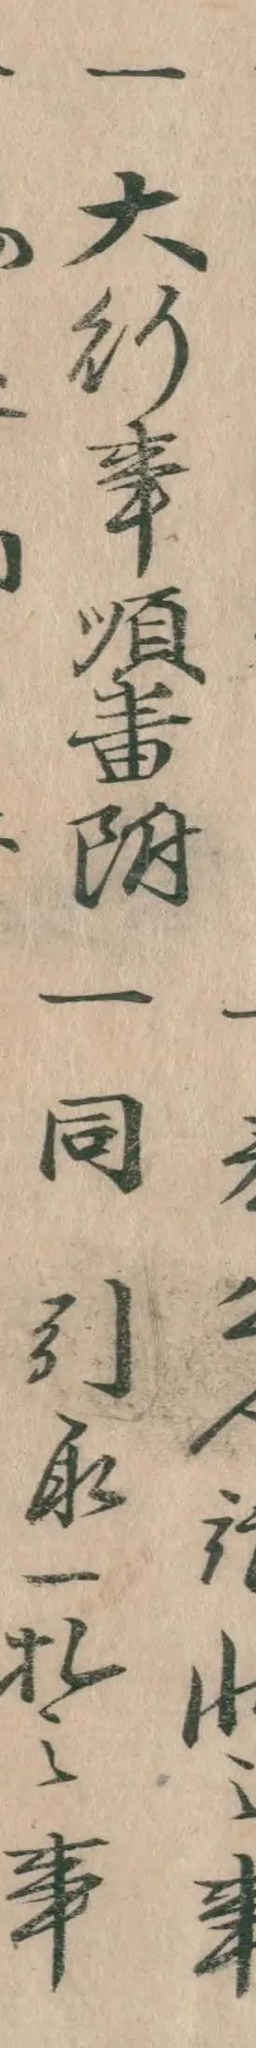一大行事順番付一同引取一札之事
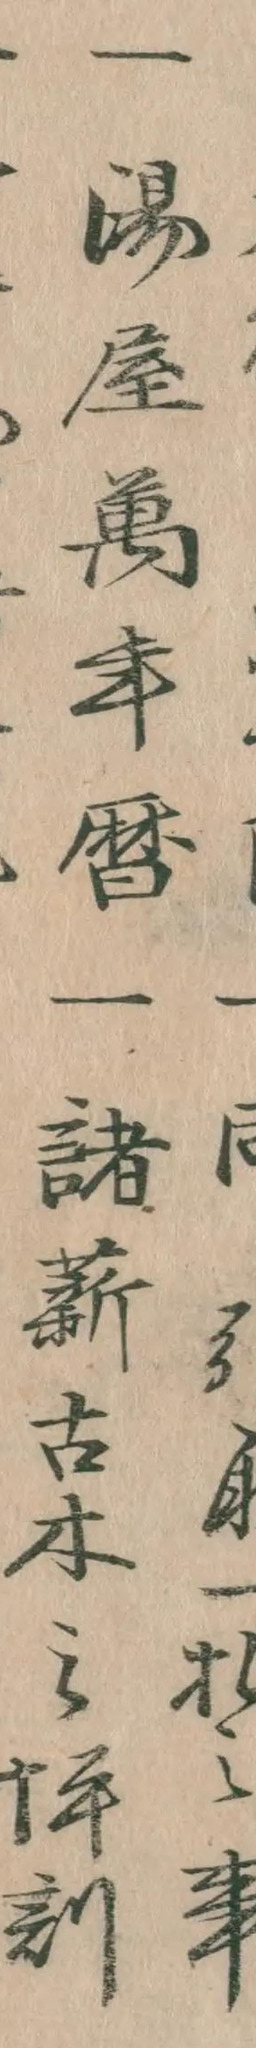一湯屋万年暦一諸薪古木之坪割
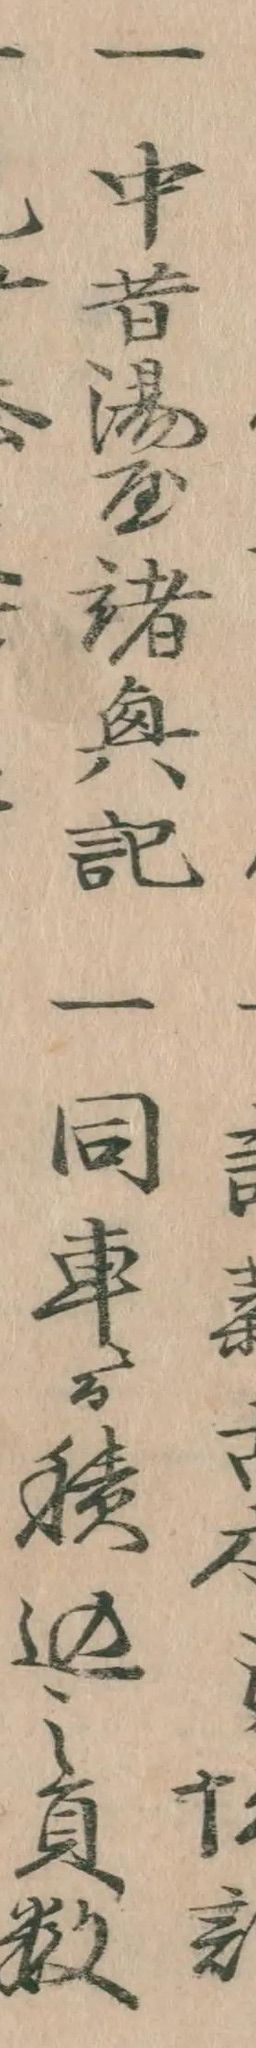一中昔湯屋諸興記一同車積込之員数
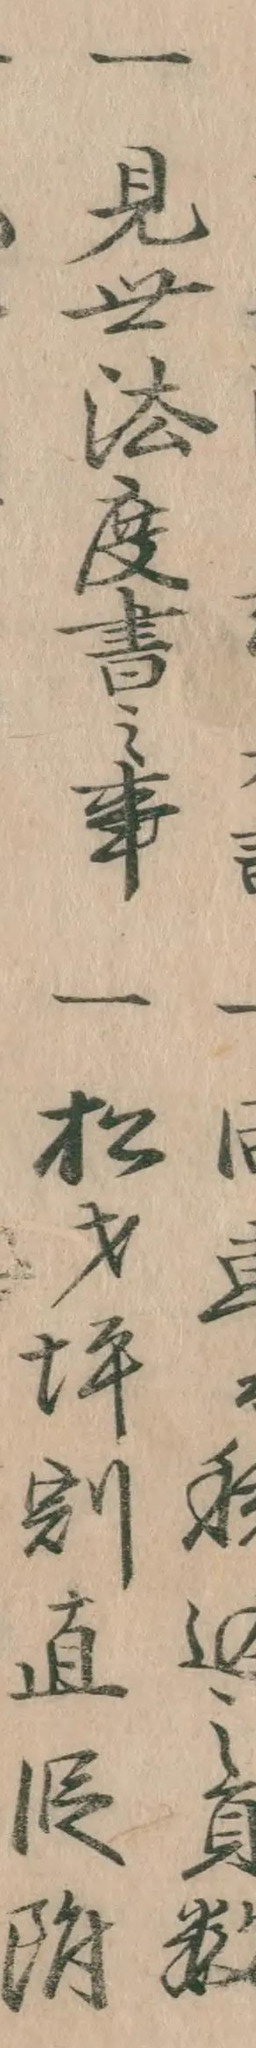一見世法度書之事一松才坪割直段付
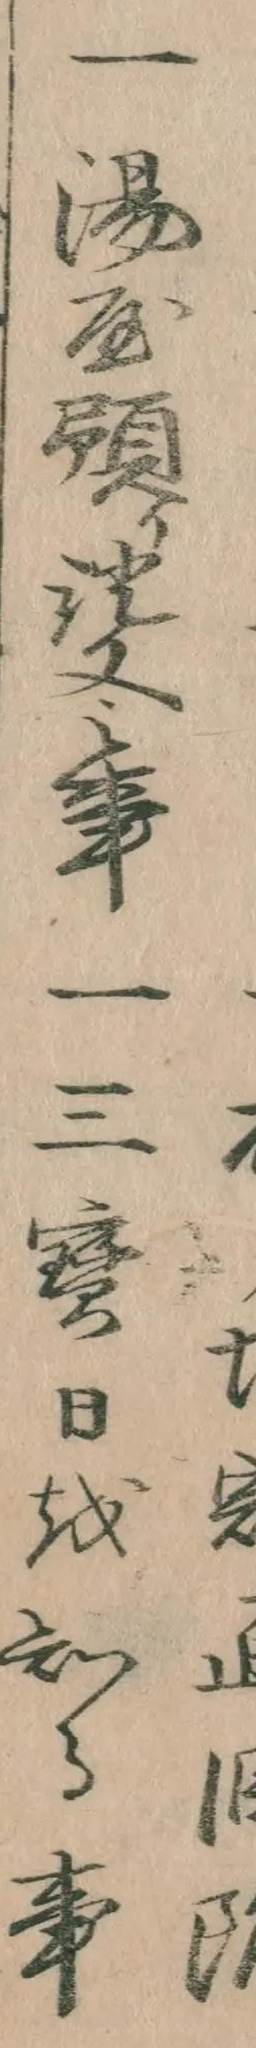一湯屋預証文之事一三宝日を知る事
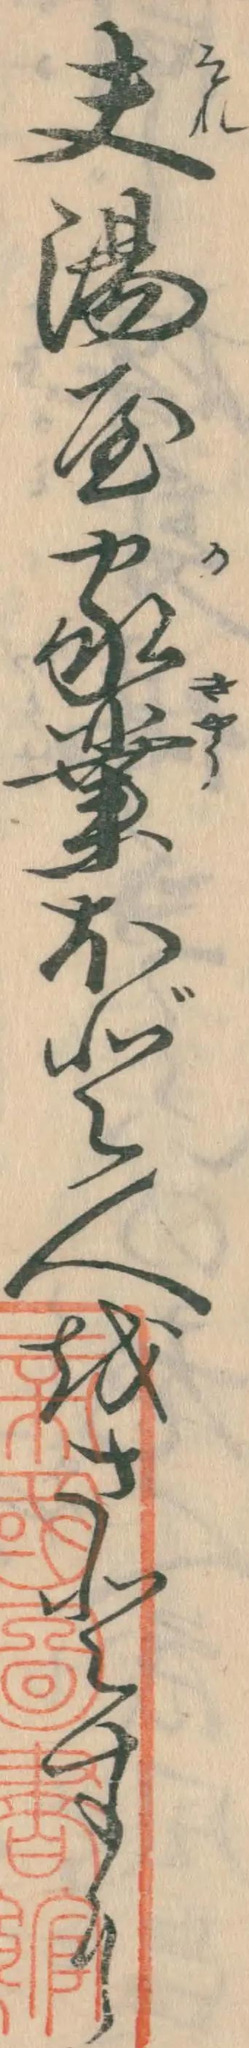夫湯屋家業ほど人をさとすに
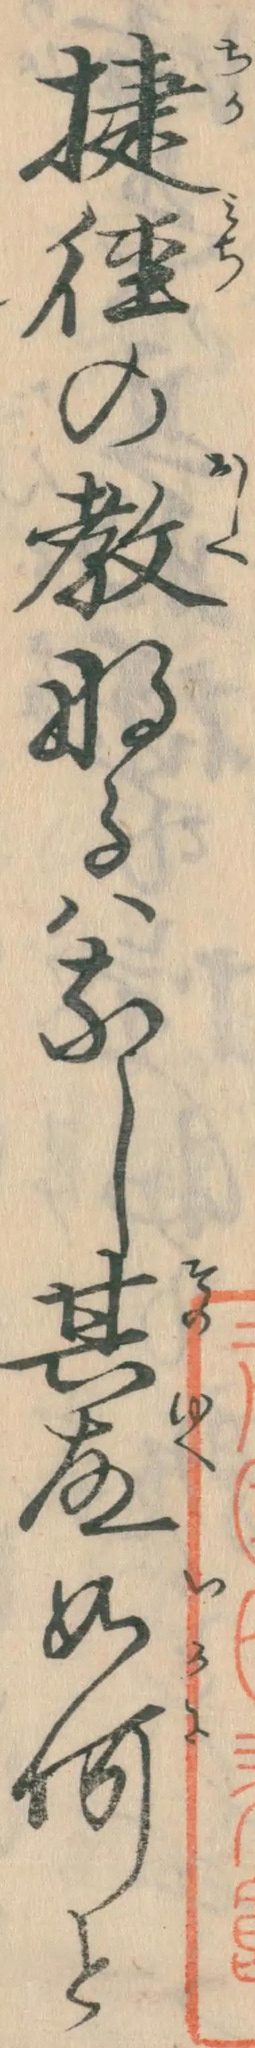捷径の教なるはなし其故如何と
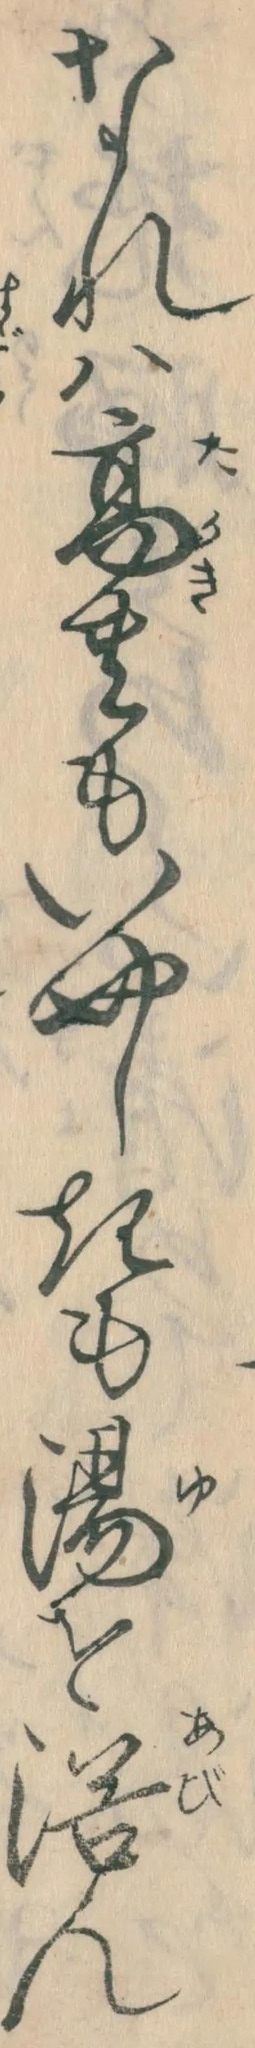なれは高貴もいやしきも湯を浴ん
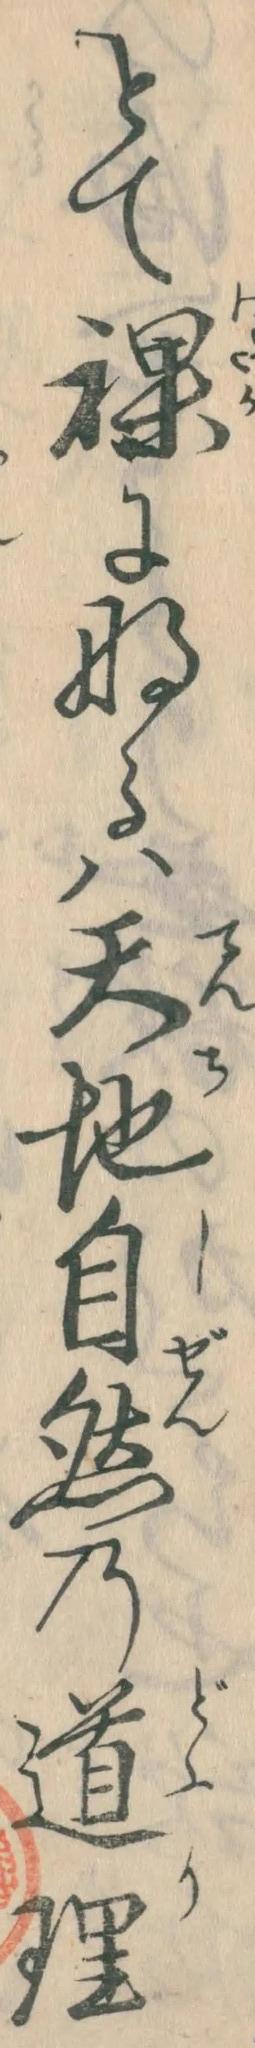とて裸になるは天地自然の道理
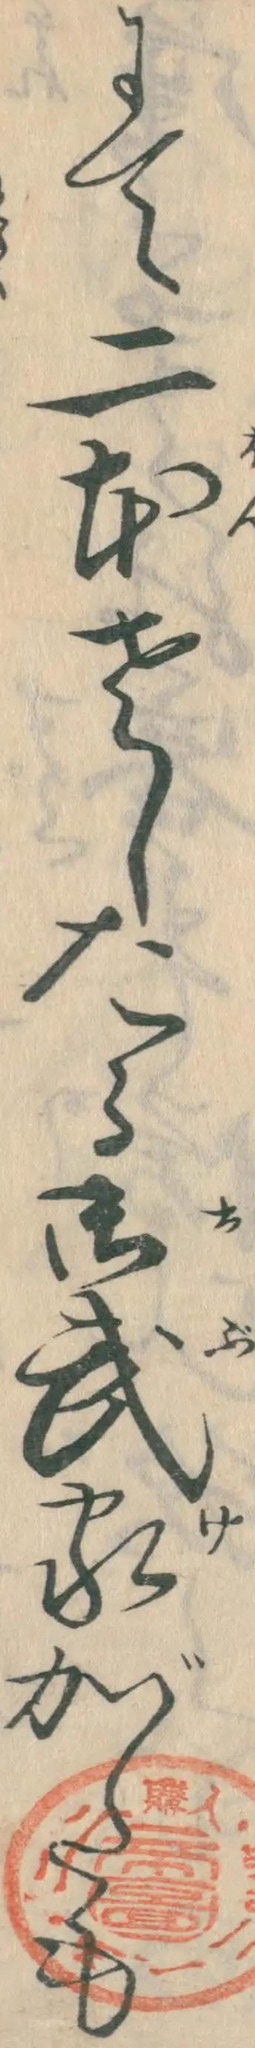にて二本さしたる御武家がたも
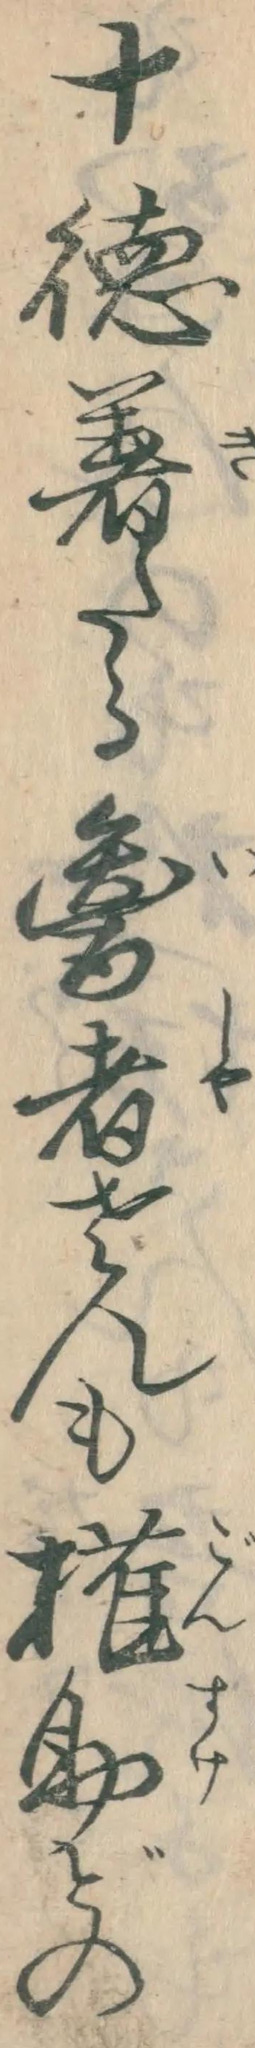十徳着たる医者さんも権助どの

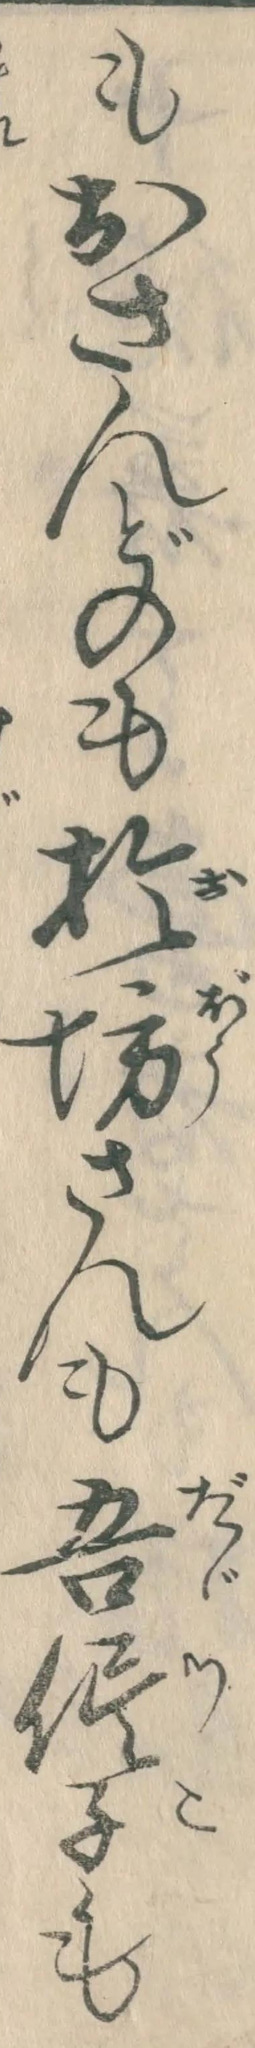もおさんどのも御坊さんも吾儘子も
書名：洗湯手引草
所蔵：国立国会図書館 National Diet Library, JAPAN
